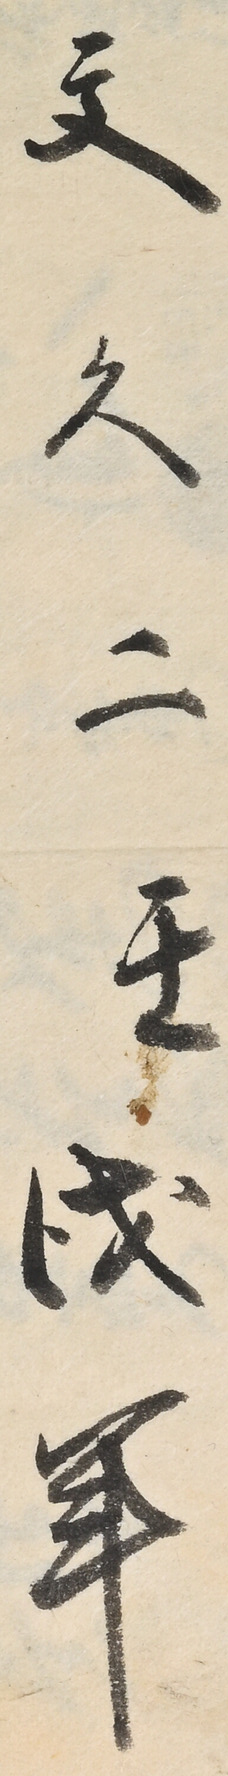㊞文久二壬戌年
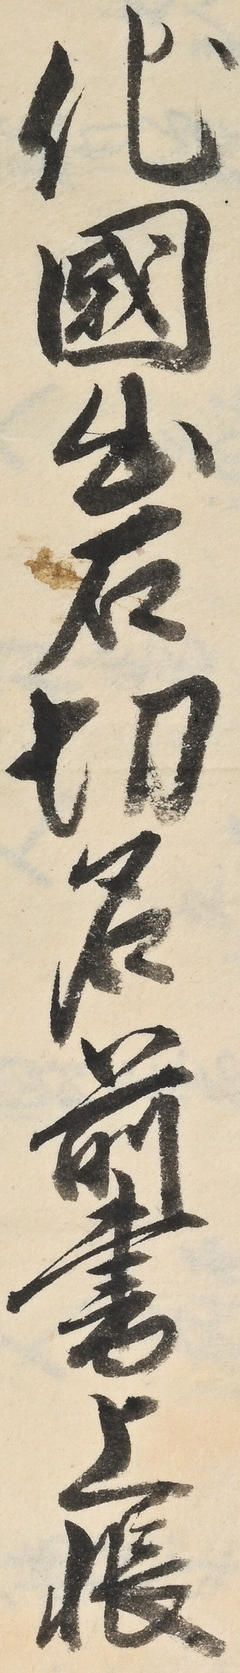他国出石切名前書上帳

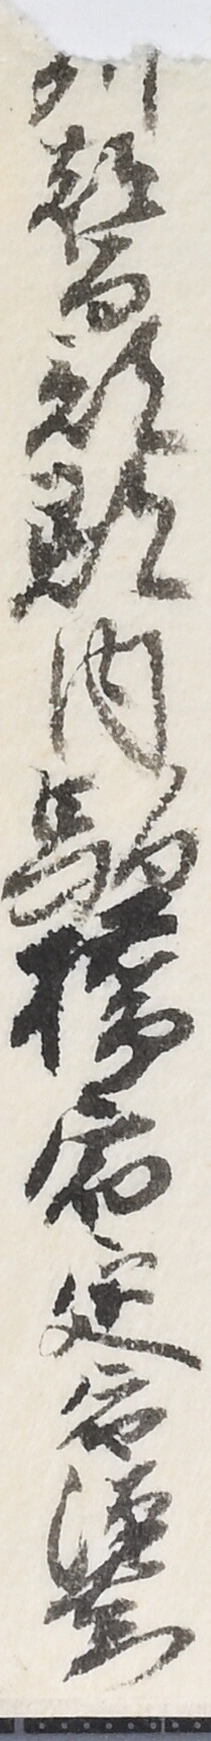都留郡郡内駒橋宿定宿源右衛門
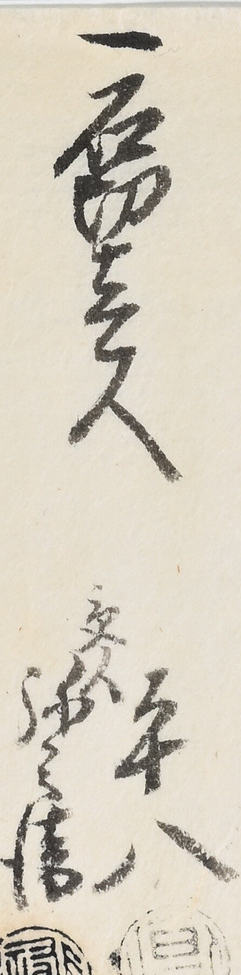一石切壱人平八㊞
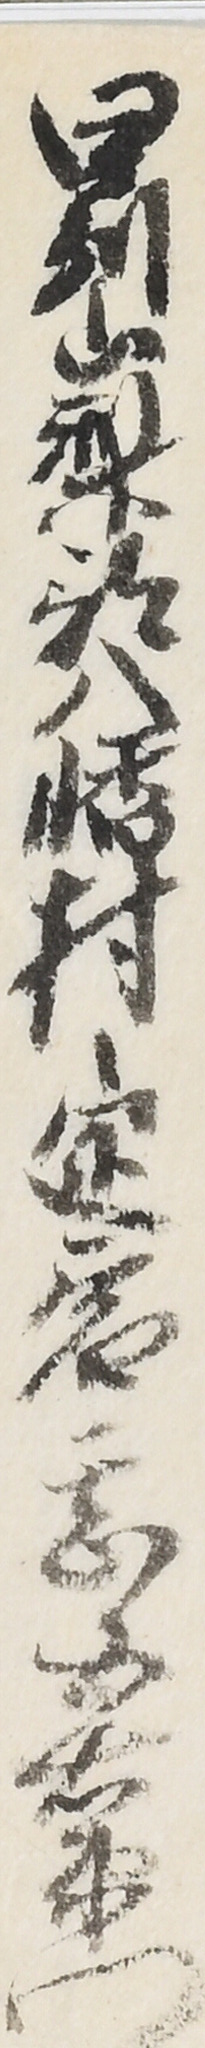甲州山梨郡八幡村定宿甚五右衛門
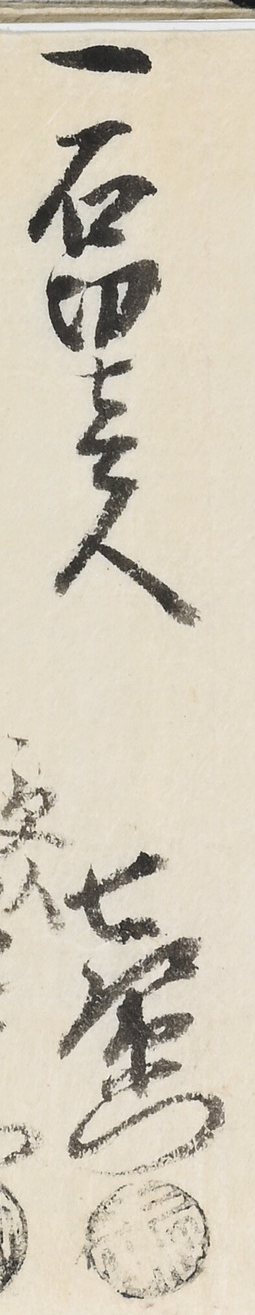一石切壱人七左衛門㊞

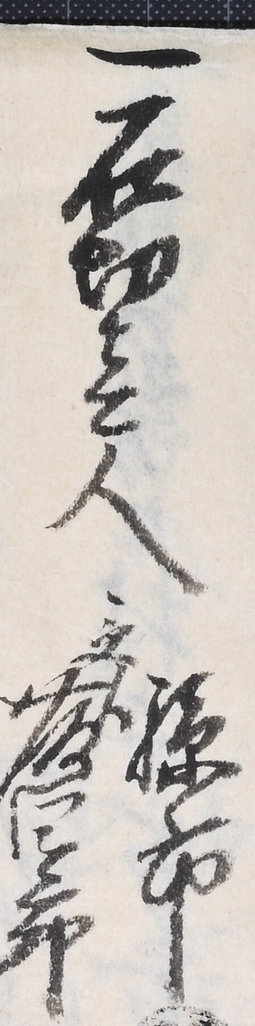一石切壱人松治㊞
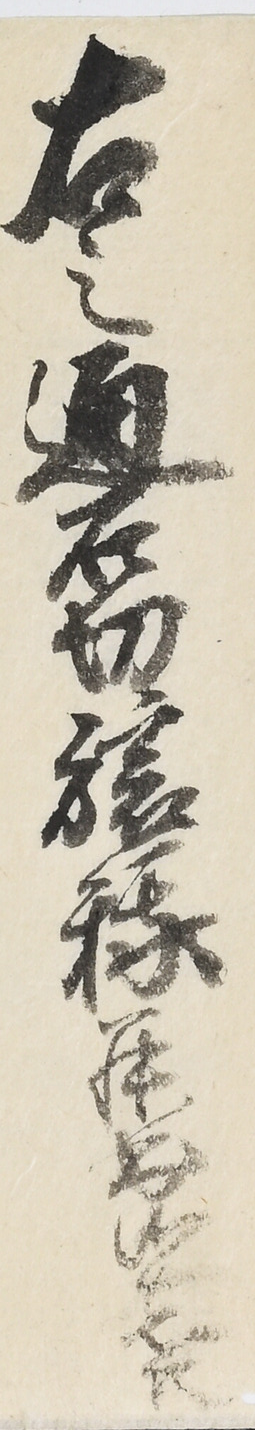右之通石切旅稼罷出候者共
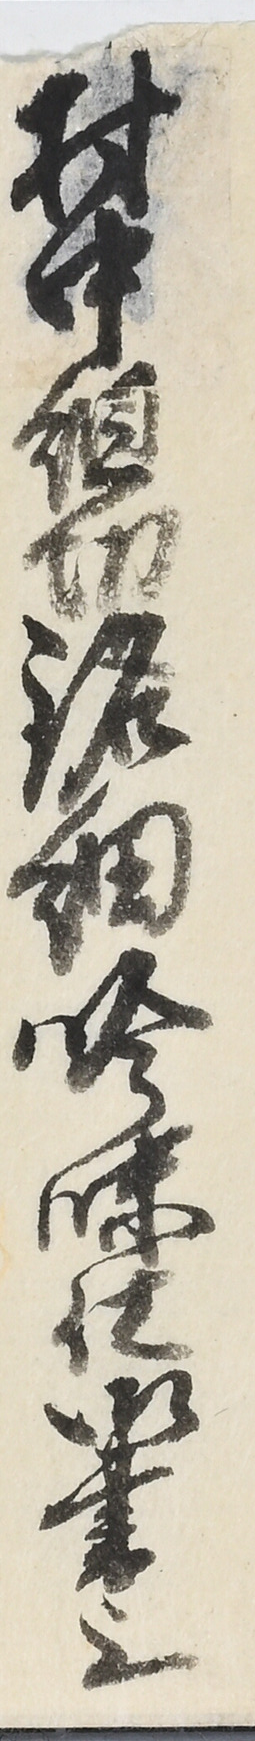村中組切銘細吟味仕御書上
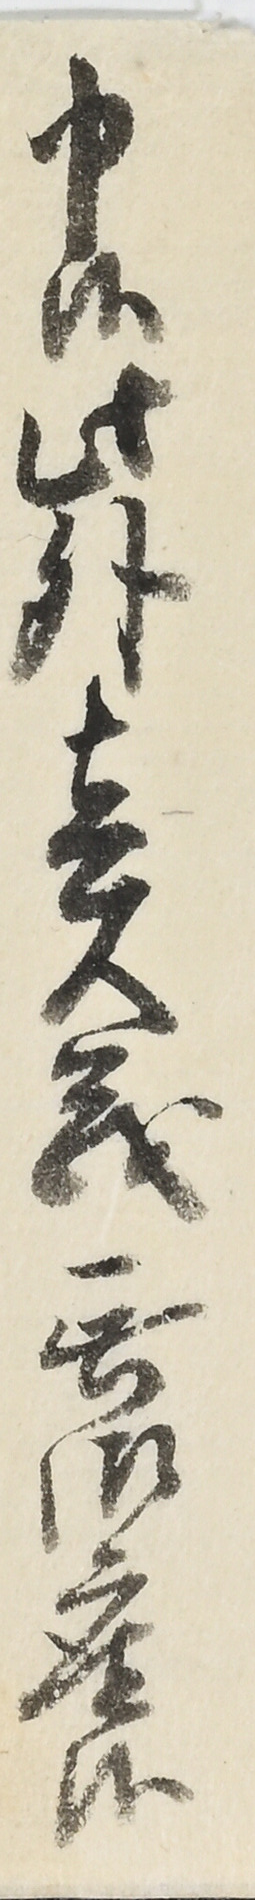申候此外壱人も無御座候
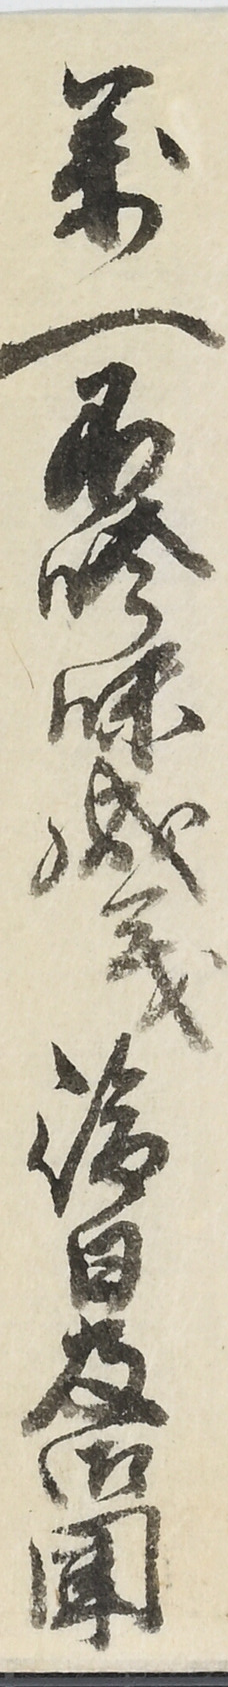万一不吟味成義後日及御聞
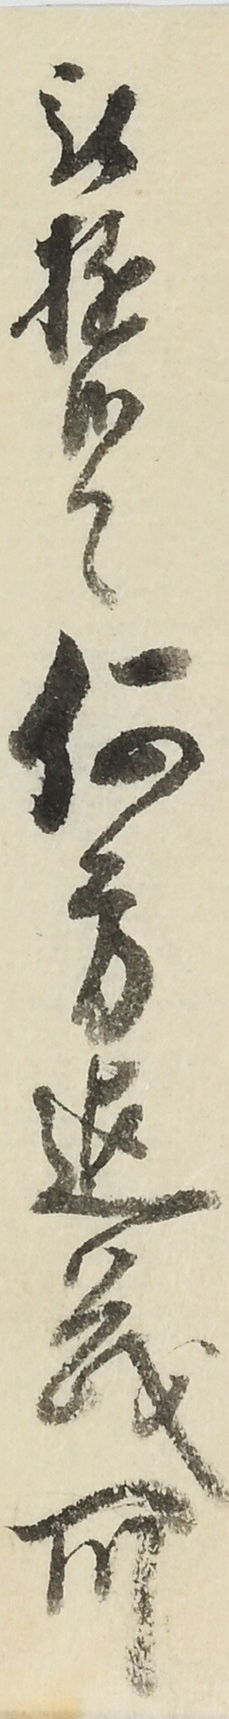被遊候ハヽ何方迄も可
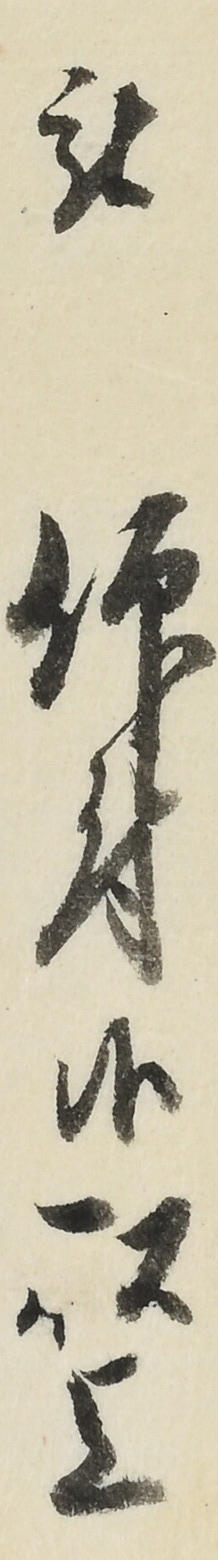被仰付候以上

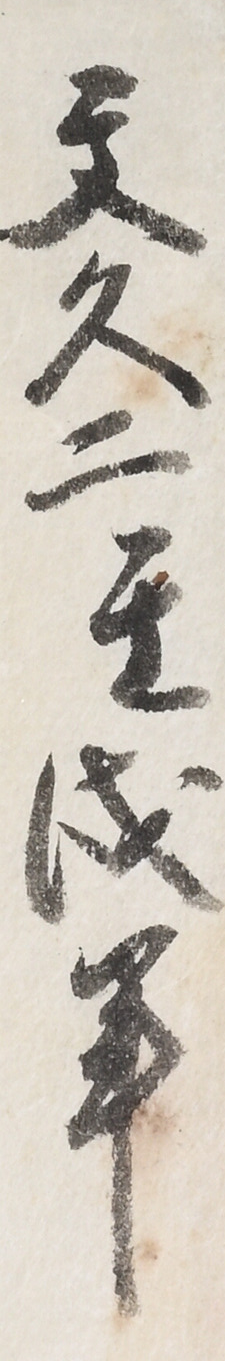文久二壬戌年
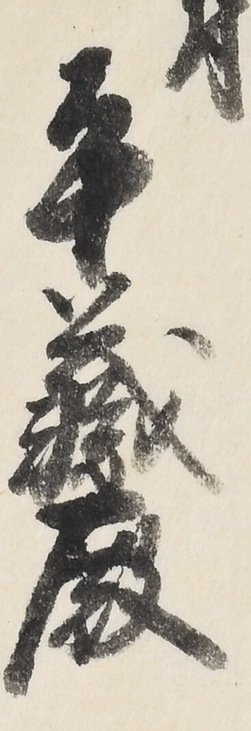平蔵殿
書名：文久二壬戌年正月他國出石切名前書上帳
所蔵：伊那市立高遠町図書館・合同会社AMANE
